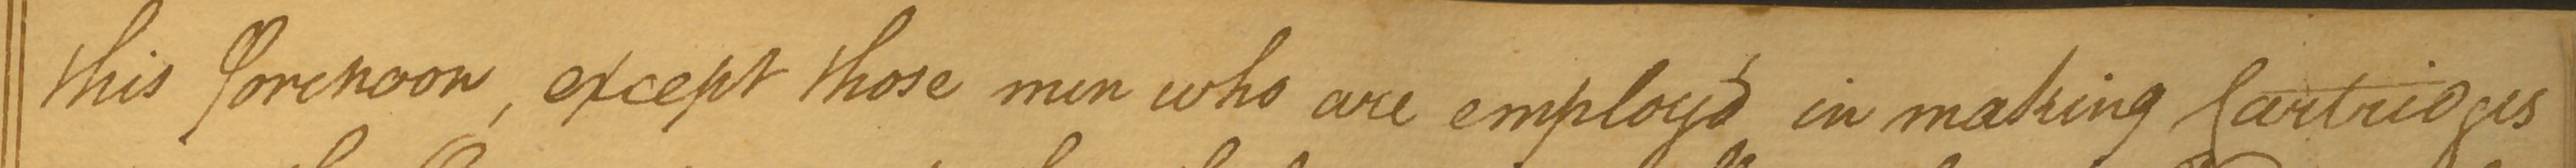this forenoon, except those men who are employ'd in making Cartridges
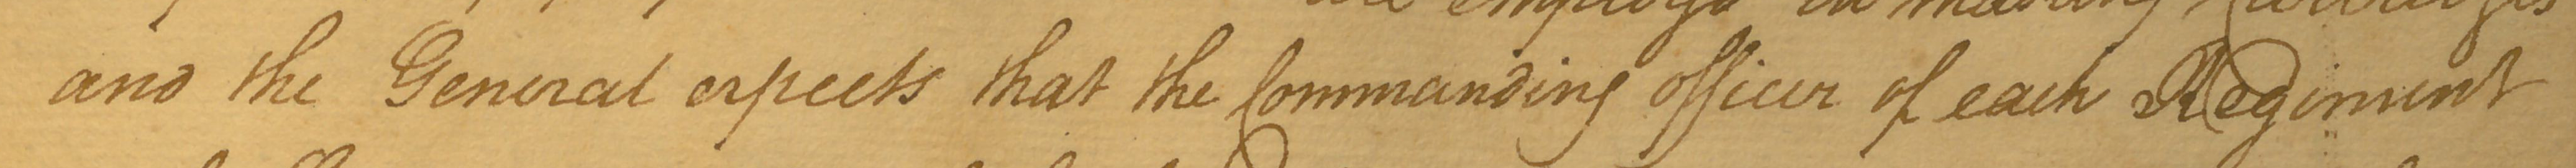and the General expects that the Commanding officer of each Regiment
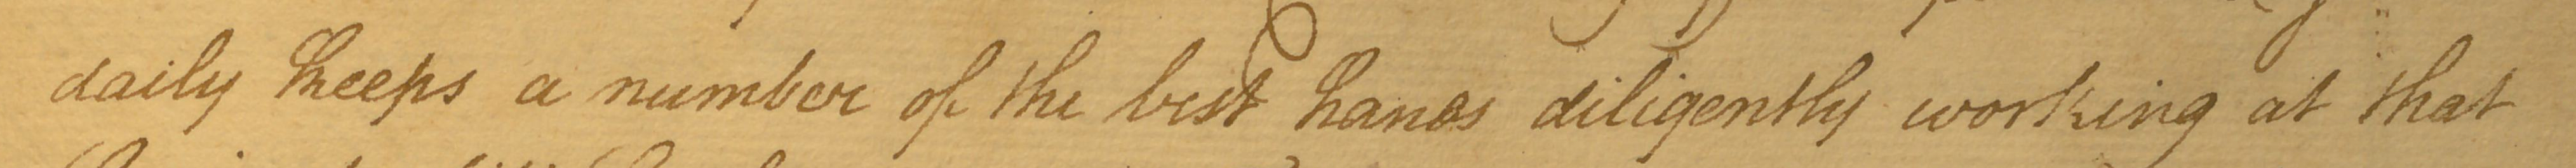daily keeps a number of his best hands diligently working at that
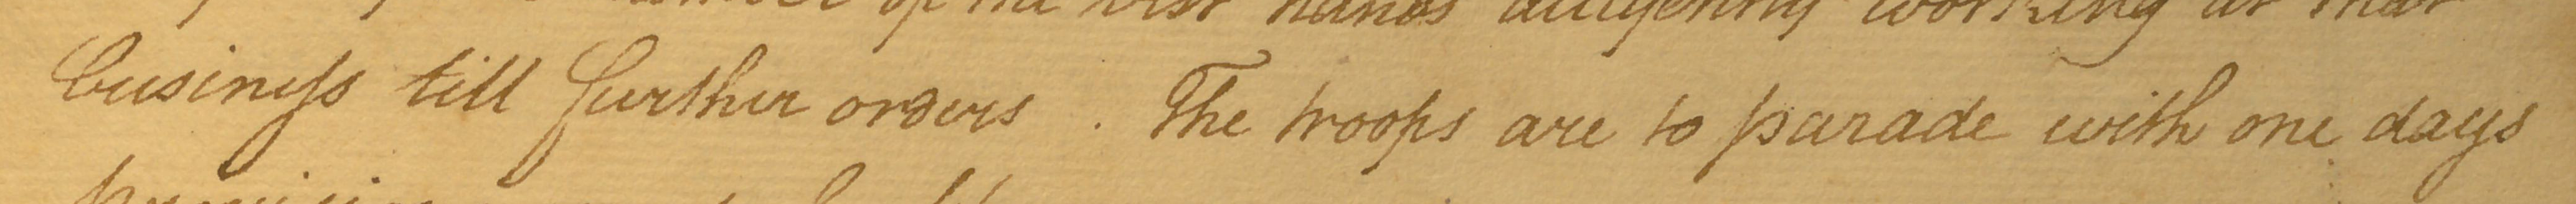business till further orders. The troops are to parade with one days
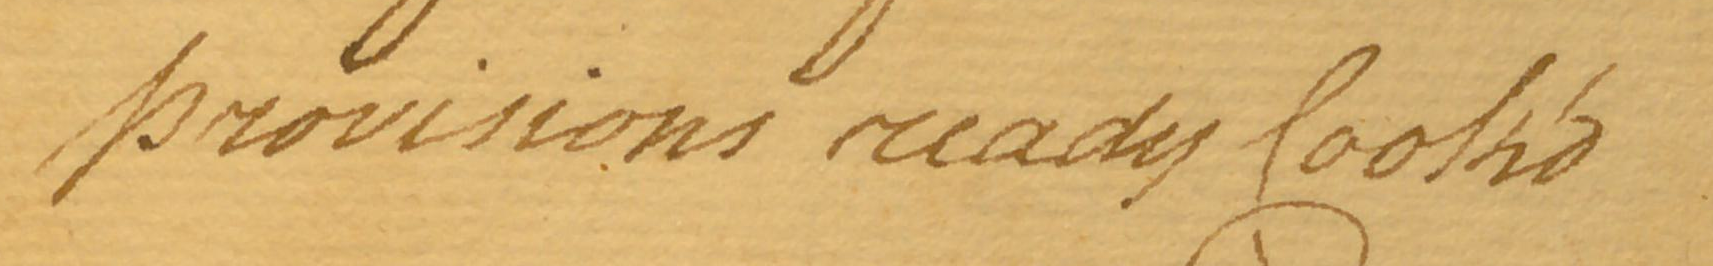provisions ready Cook'd
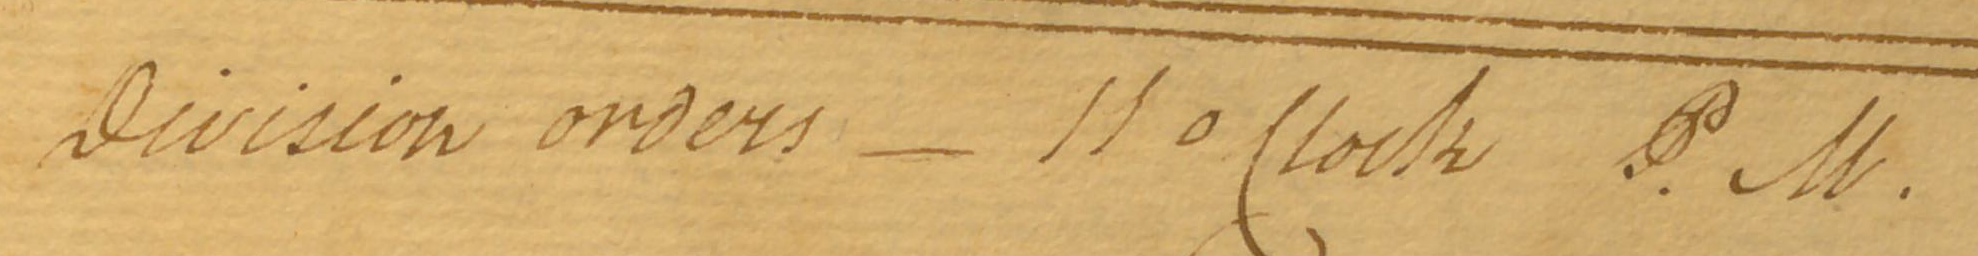Division orders- 11 oClock P.M.
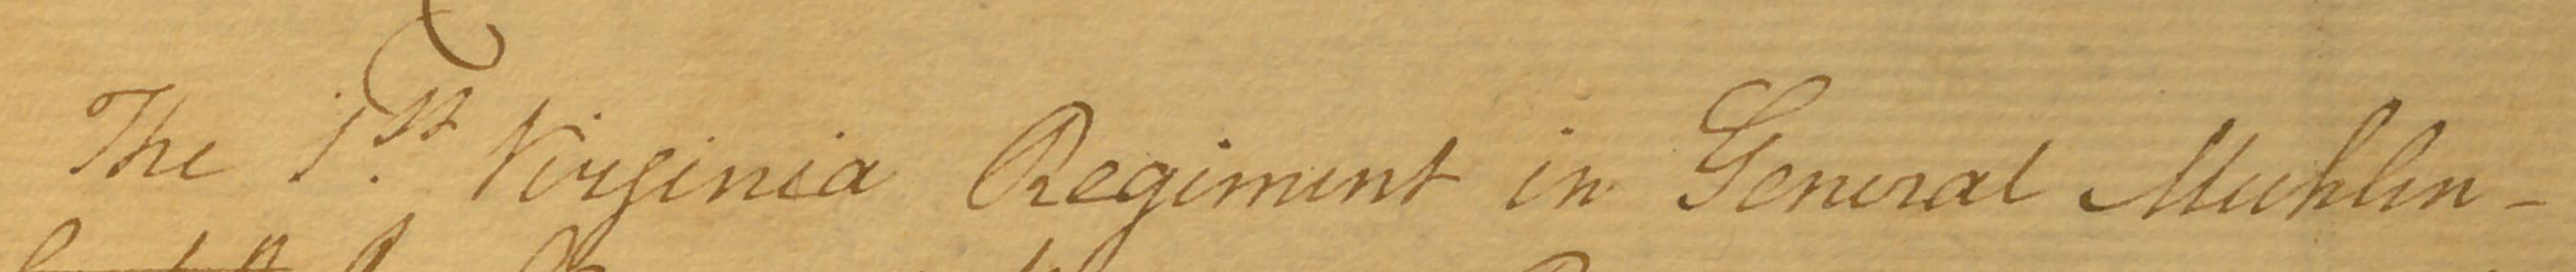The 1^st Virginia Regiment in General Muhlen-
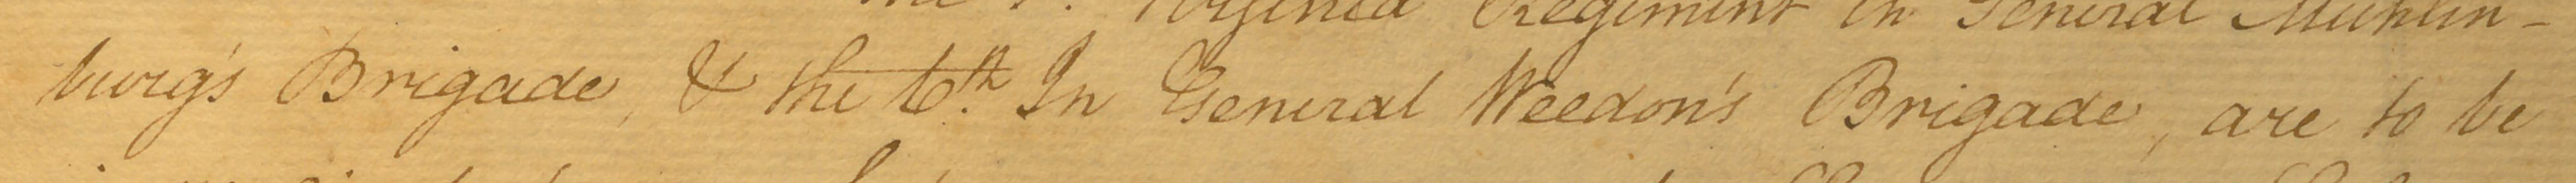burg's Brigade & the 6^th In General Weedon's Brigade, are to be
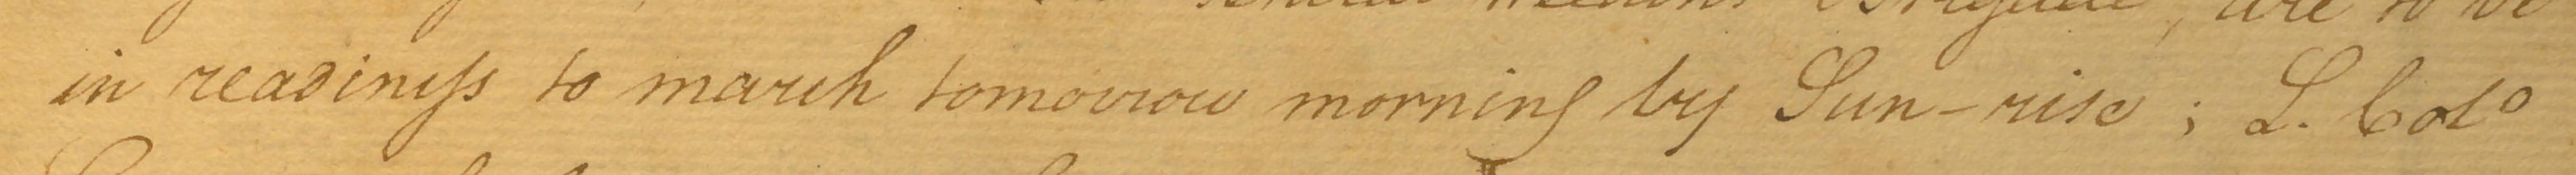in readiness to march tomorrow morning by Sun-rise; L. Col^o
